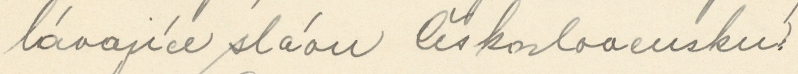lávajíce slávu Československu.
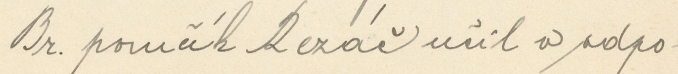Br. poručík Řezáč učil v odpo-
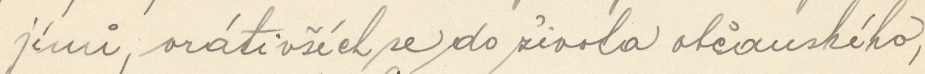jínů, vrátivších se do života občanského,
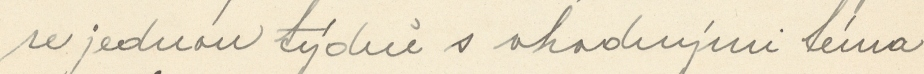se jednou týdně s vhodnými téma-
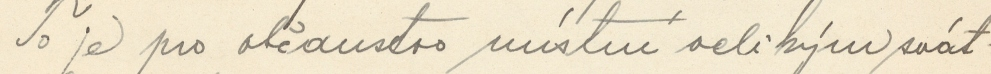To je pro občanstvo místní velikým svát-
